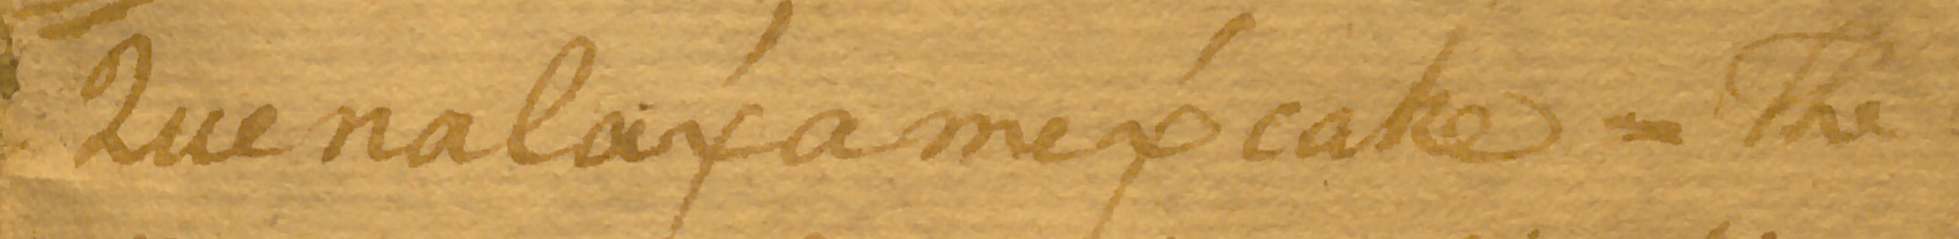Quenaláxaméxcake = The
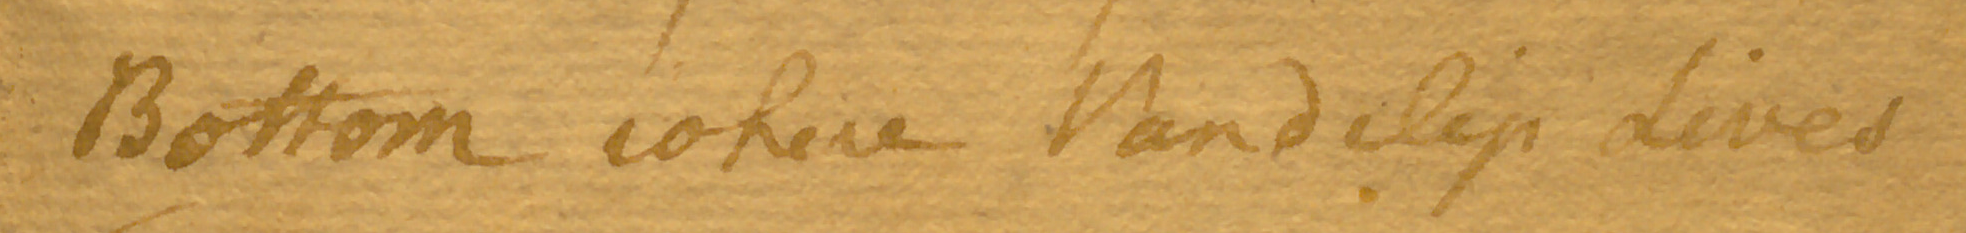Bottom where Vandelip Lives
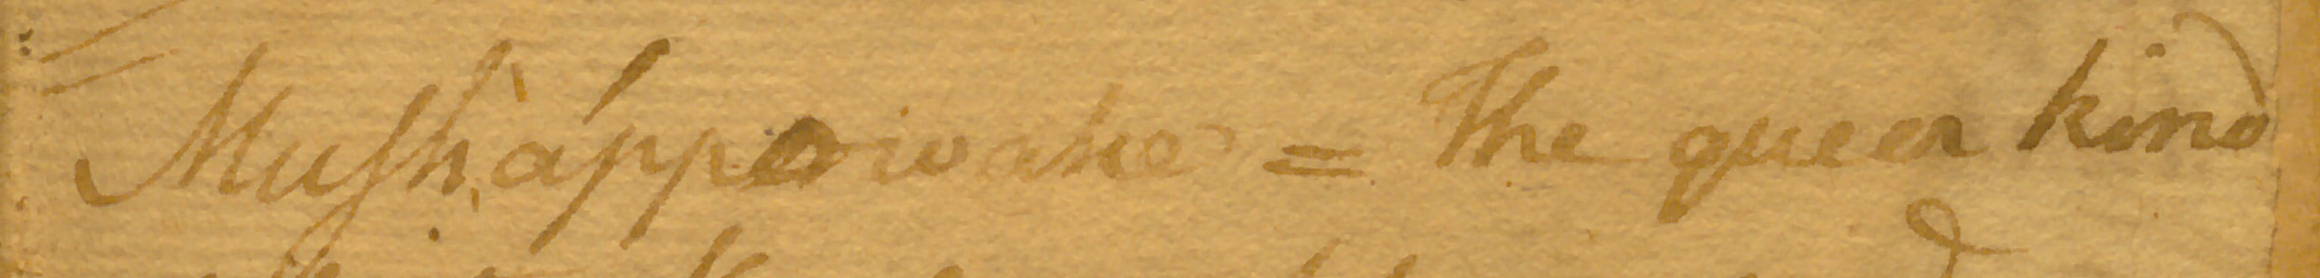Musháppowake = The queer kind
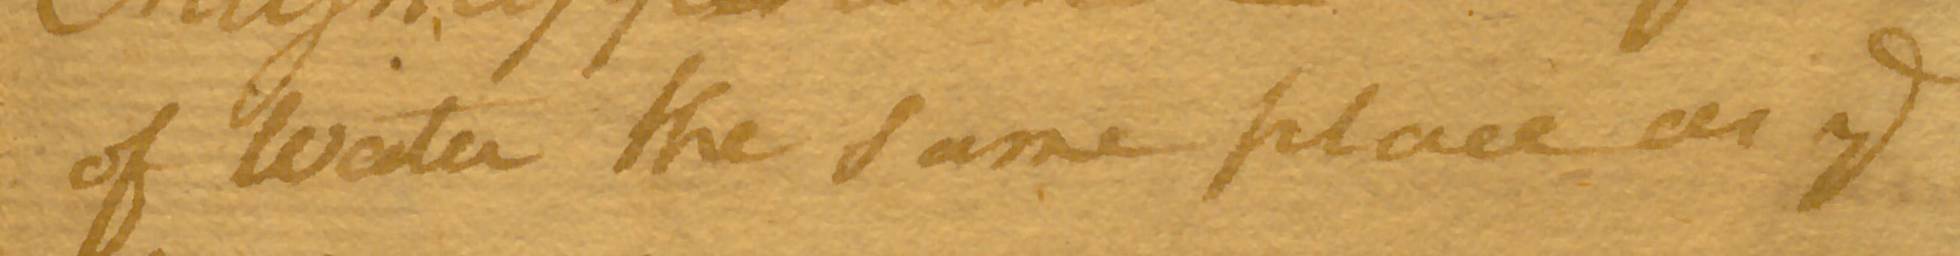of water the same place as y^e
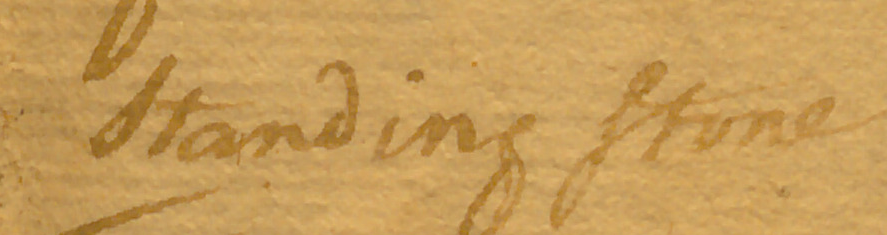standing stone
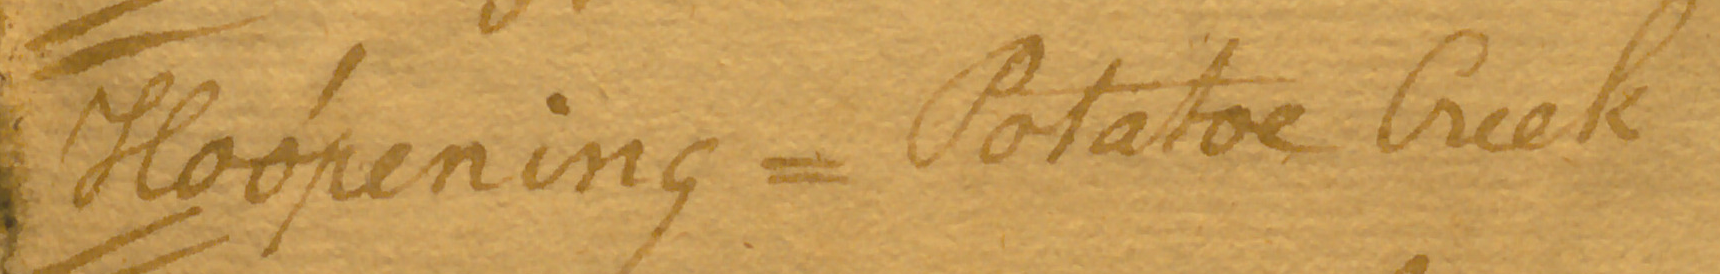Hoópening = Potatoe Creek
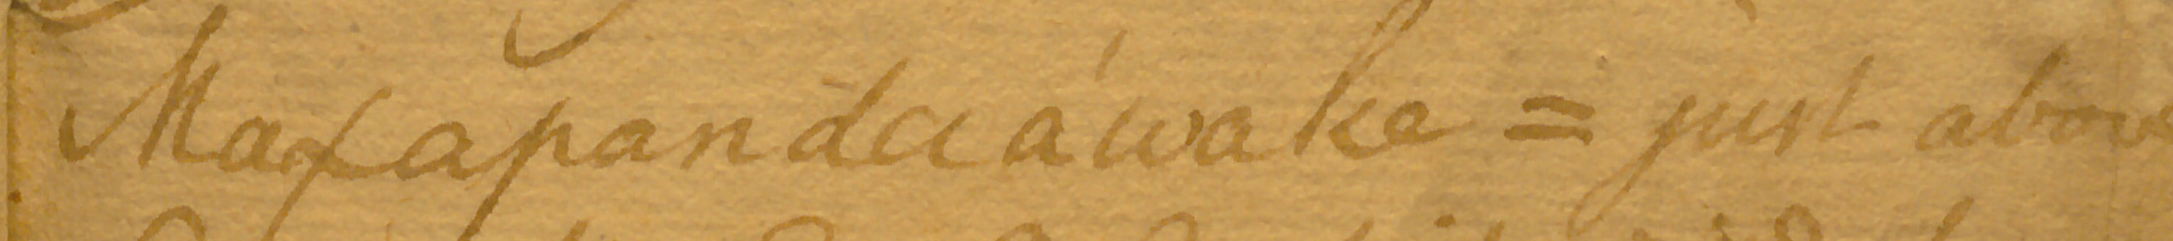Maxapandaawake = just above
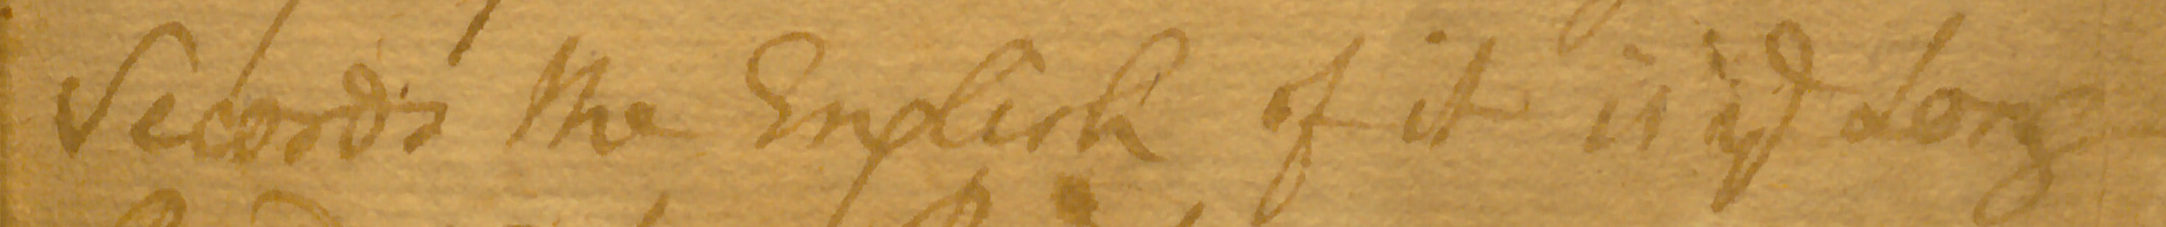Secprds the Enplirk of it is y^e Long
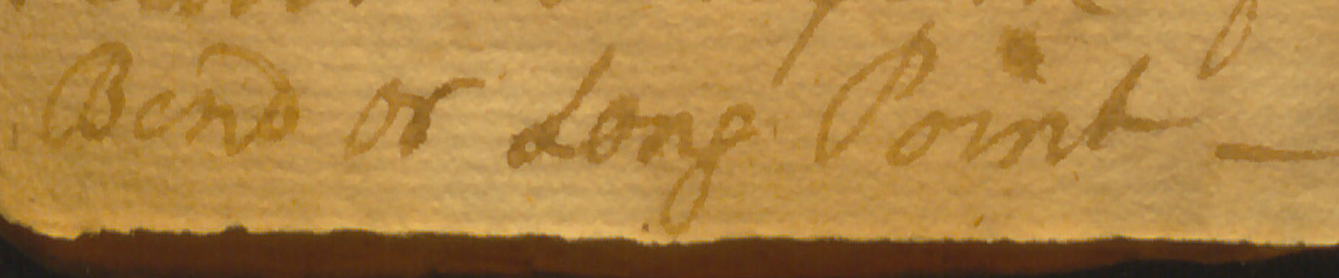Bend or Long Point-
